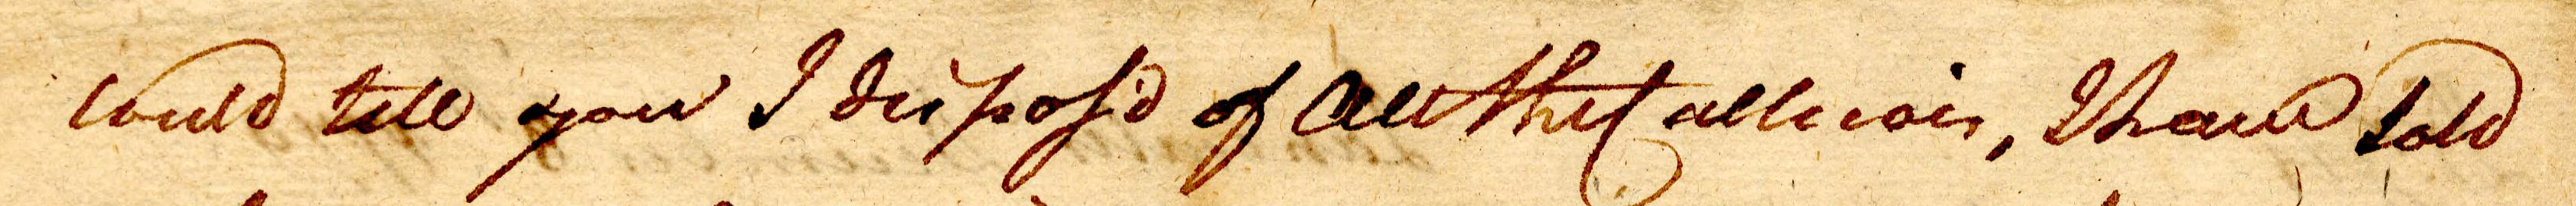could tell you I dispos'd of all the Callecois, I have sold
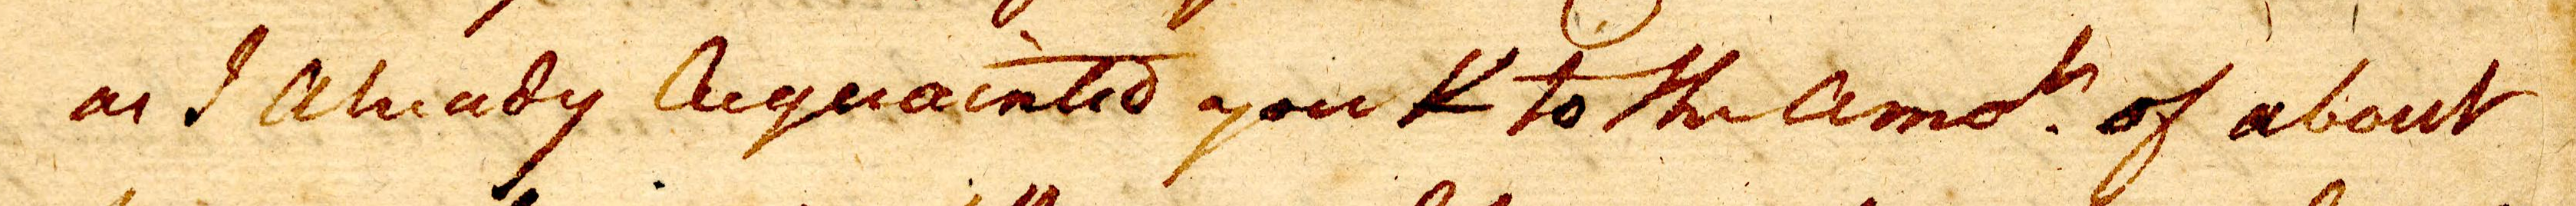as I Already Acquainted you & to the Amo^ts. of about
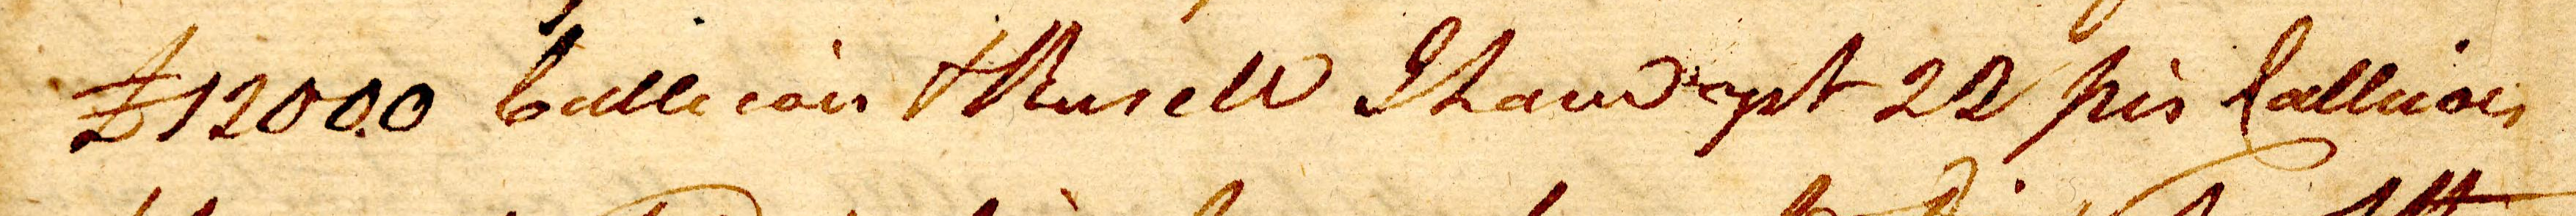£ 1200.0 Callecois & Burrell I have yet 22 pis Callicoes
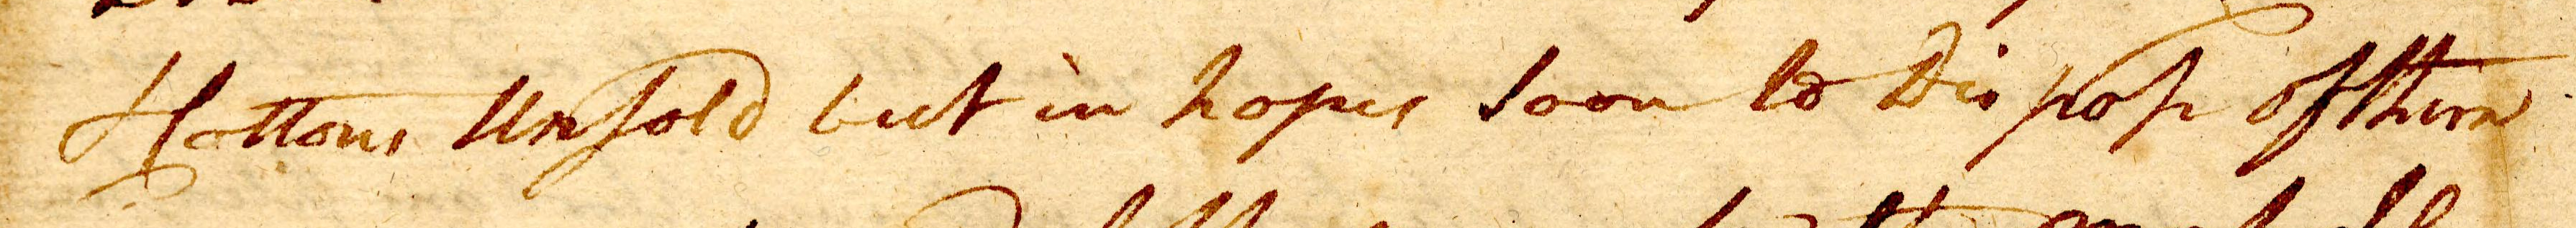& Cottons Unsol'd but in hopes soon to Dispose of them
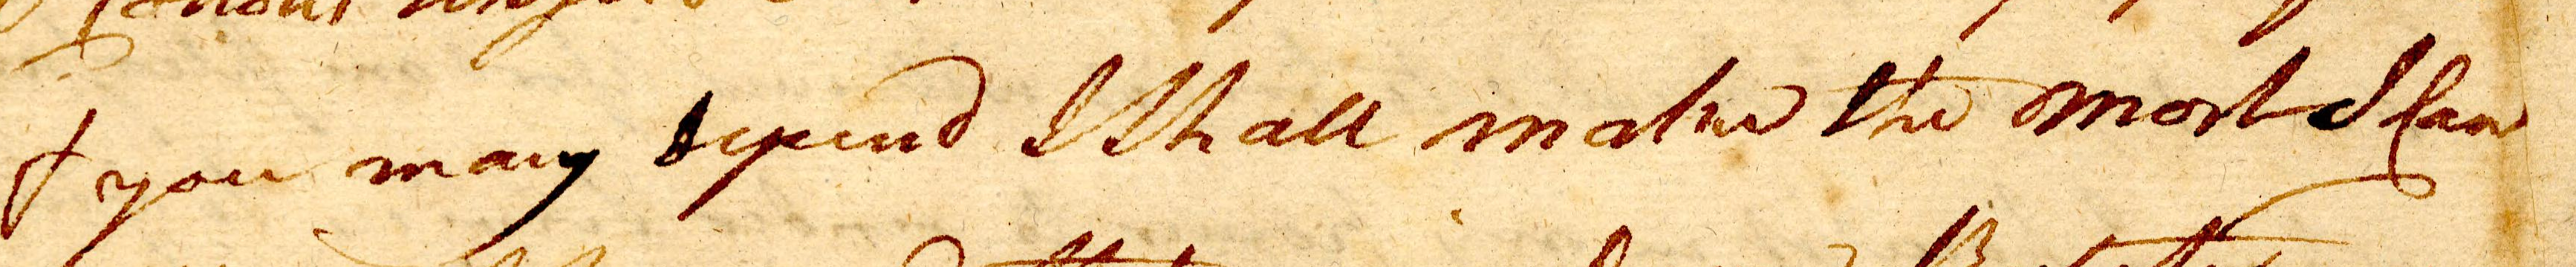& you may depend I shall make the most I can
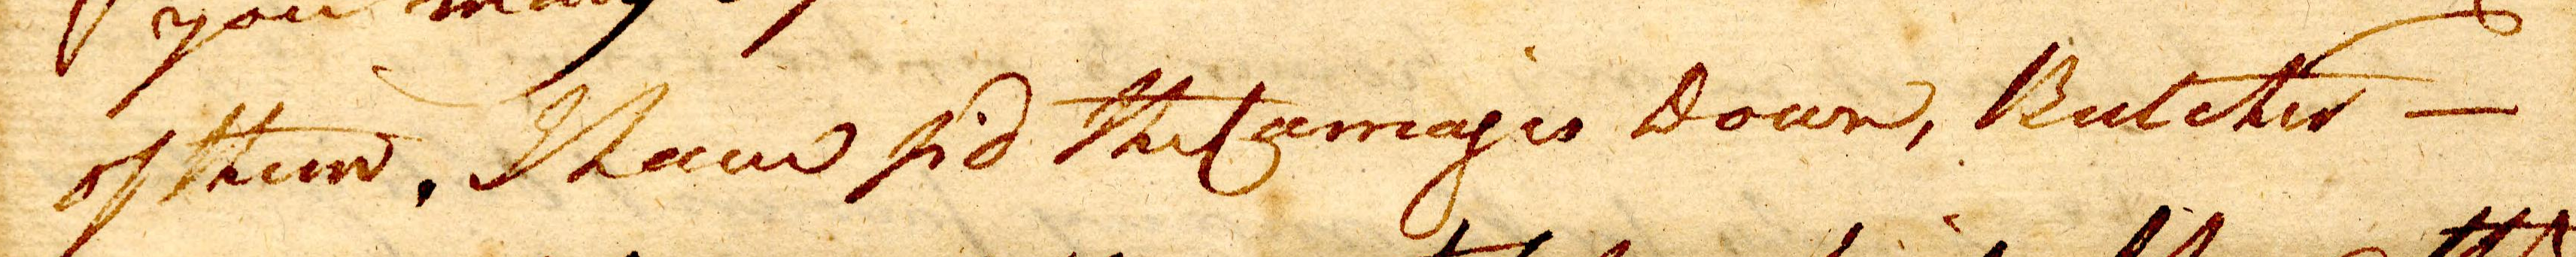of them, I rece^d p'd the Carriages Down, Butcher-
